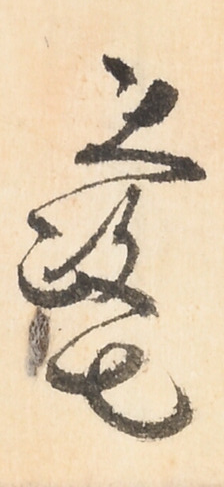使政七
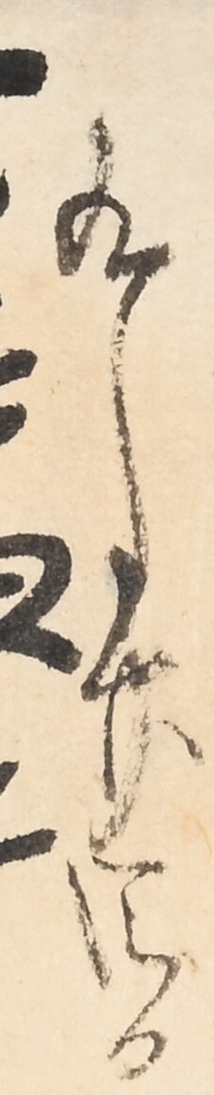九月廿四日
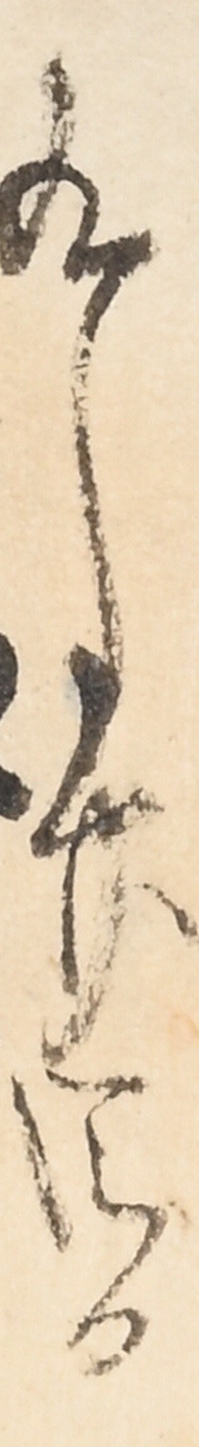九月廿四日
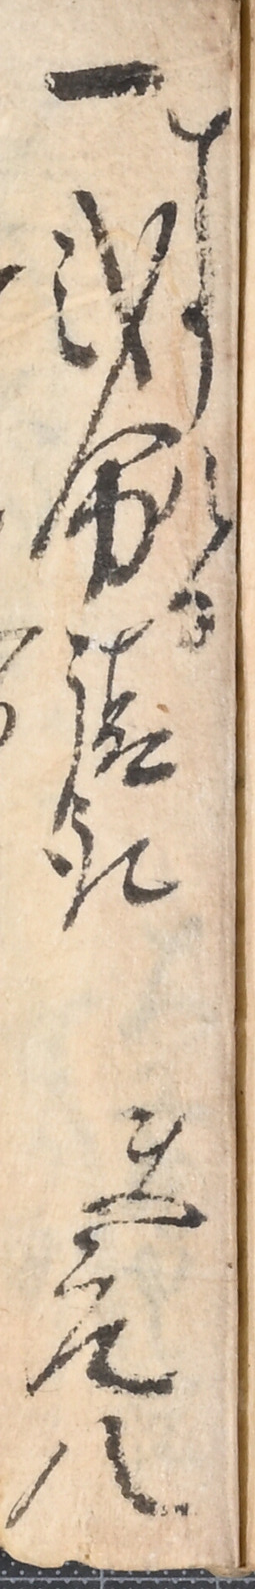一壱両請取使元八
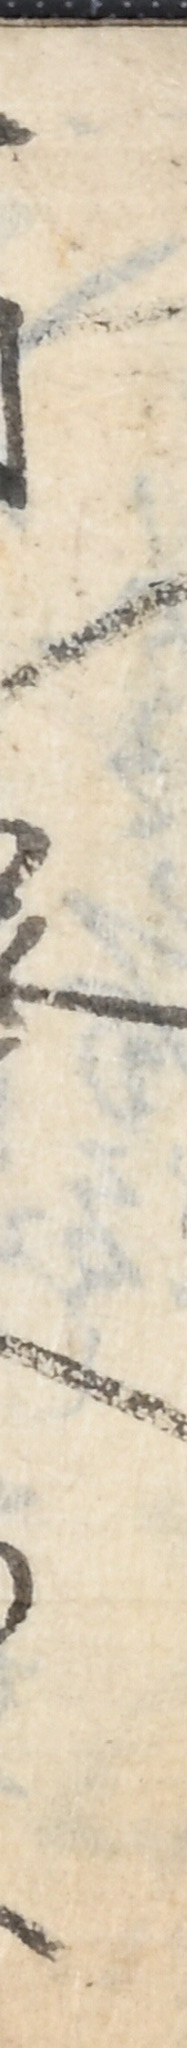一同壱両同人

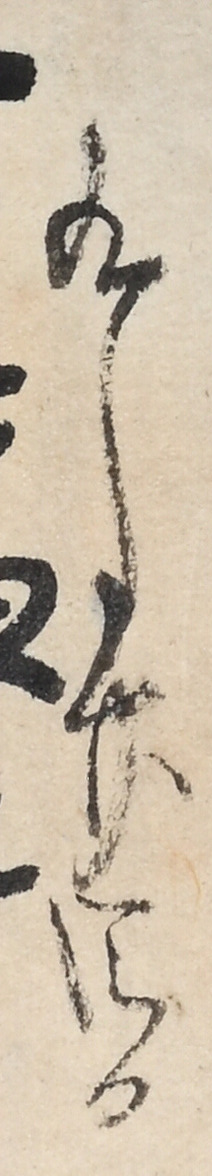極月廿三日
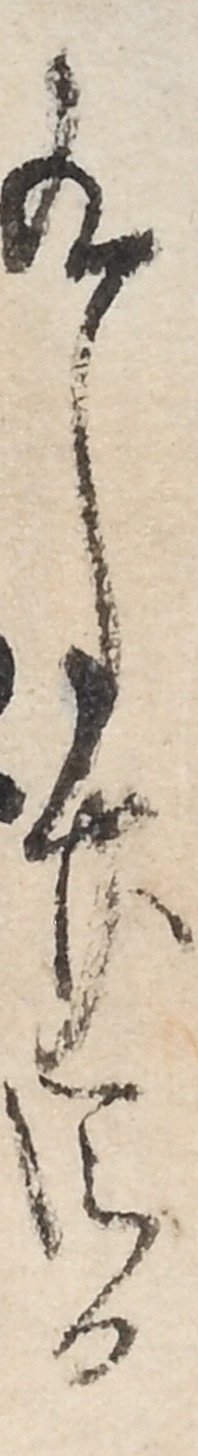極月廿三日
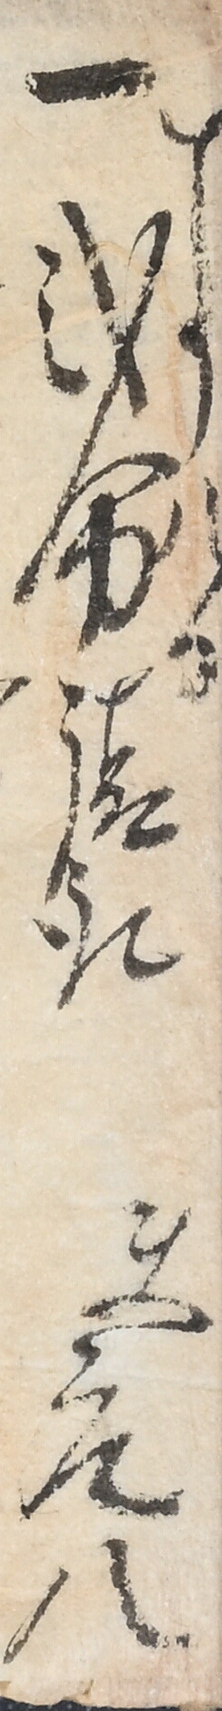一弐分請取庄八
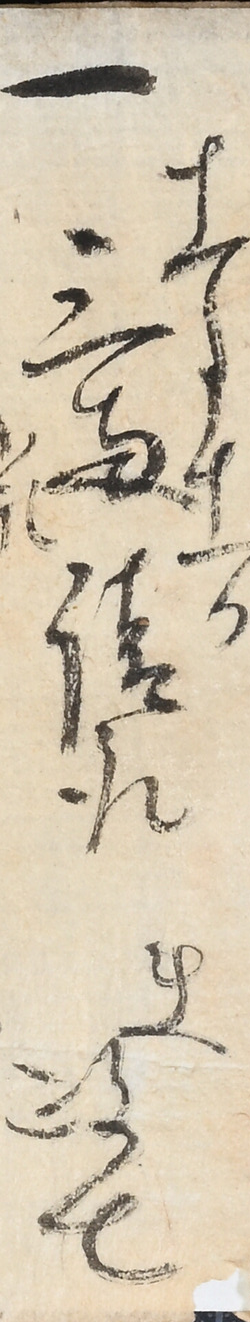一三両請取政七
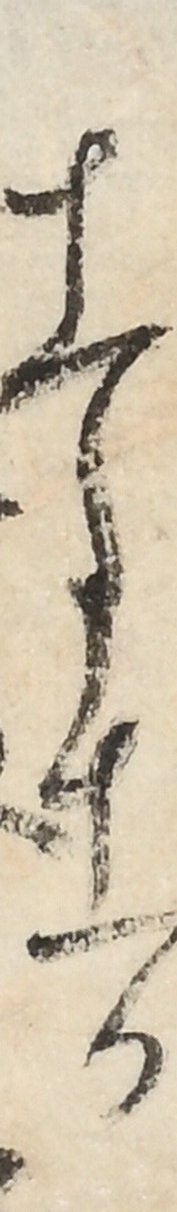十一月十一日使
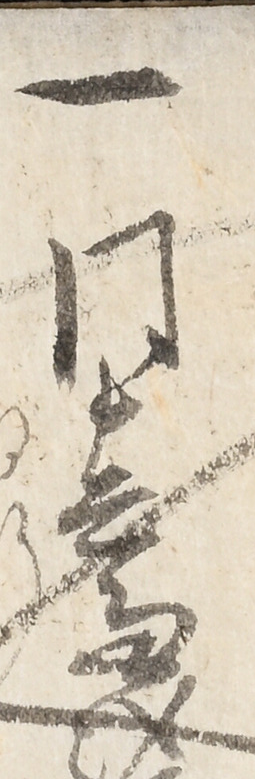一同三両取
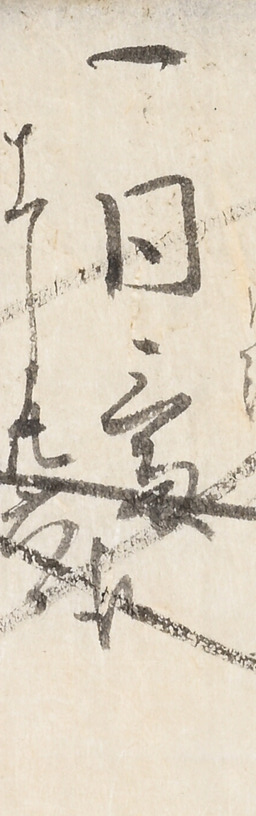一同三両取
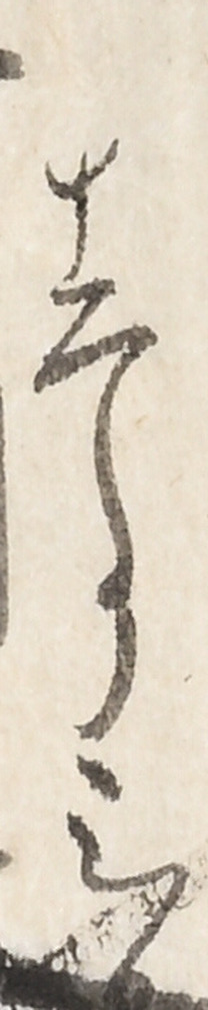十二月三日
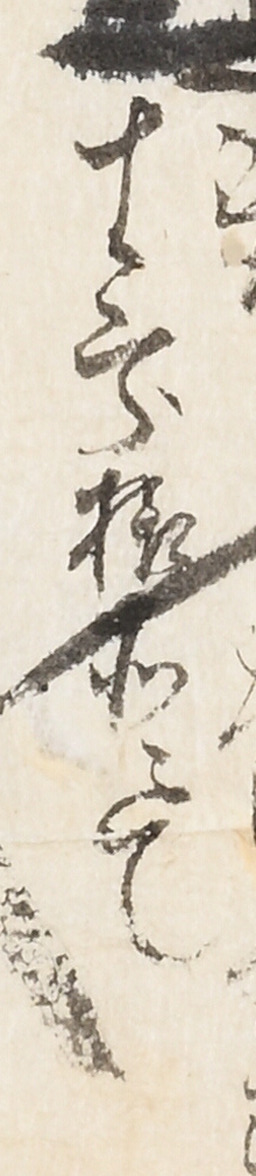十三郎様所ニて
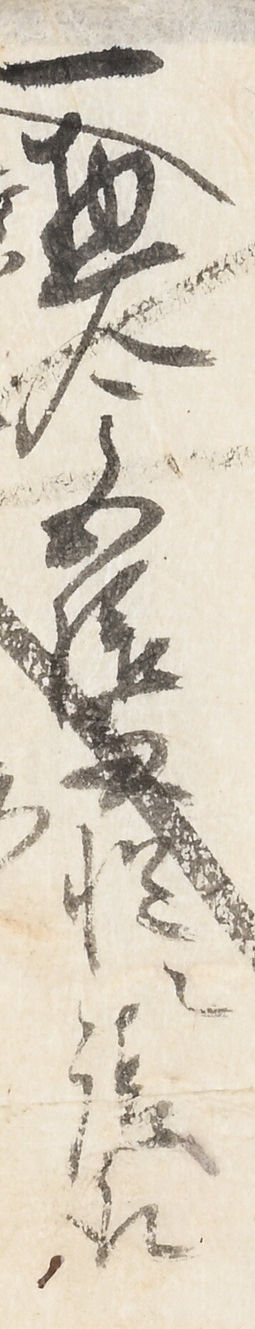一惣合五拾両慥ニ請取
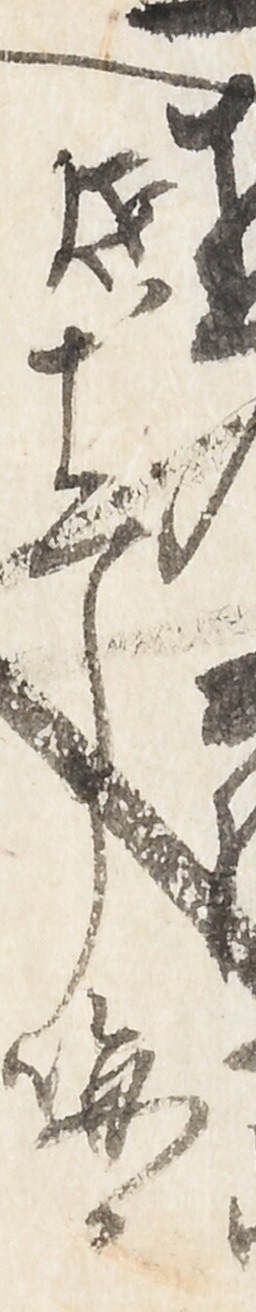戌ノ十二月晦日
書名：合力覚帳
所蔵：伊那市立高遠町図書館・合同会社AMANE
